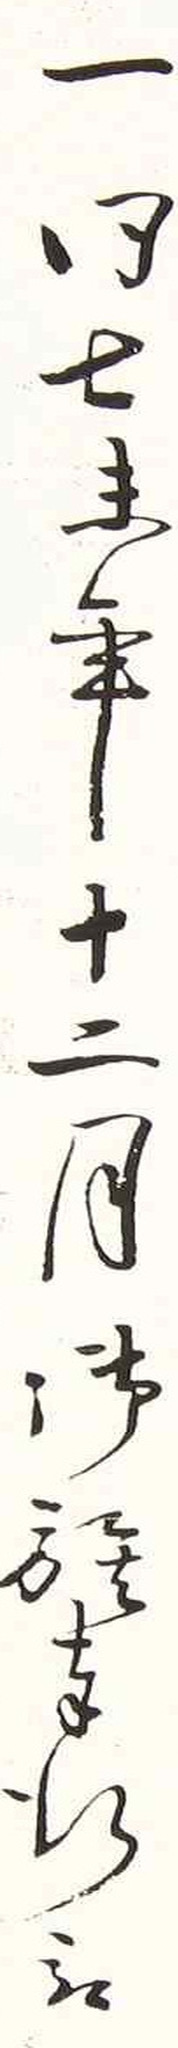一同七未年十二月御旗奉行被
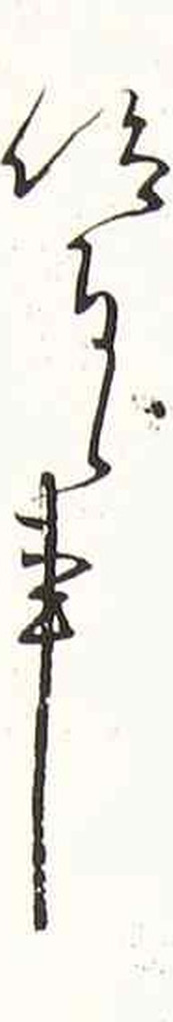仰付候事
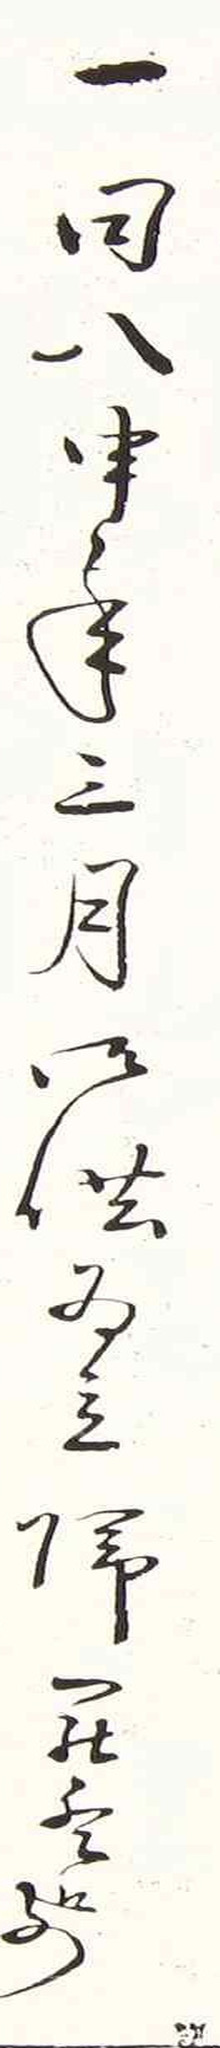一同八申年三月御供為立帰罷登候事
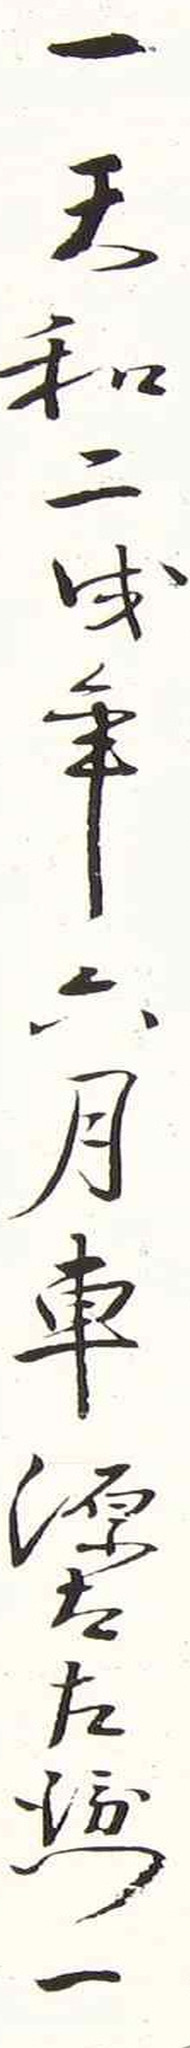一天和二戌年六月車源太左衛門一
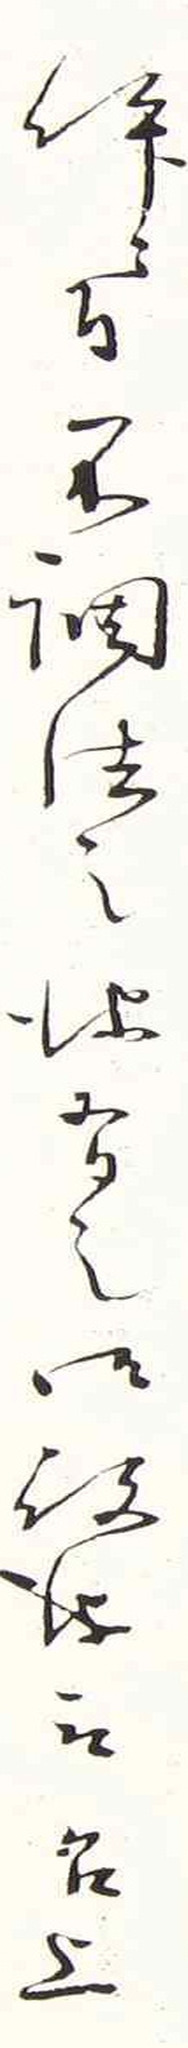件ニ付不調法之儀有之御役儀被召上
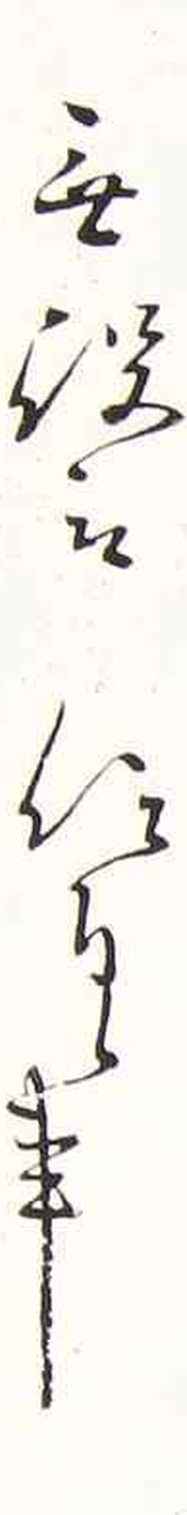無役被仰付候事
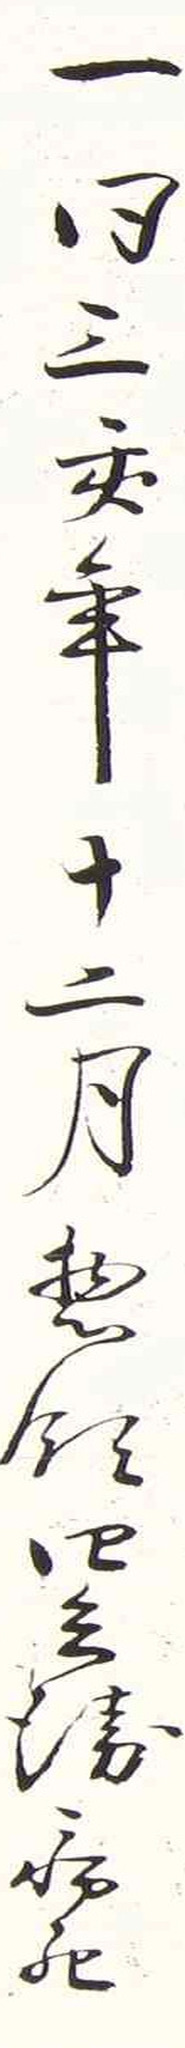一同三亥年十二月惣領四兵衛病死
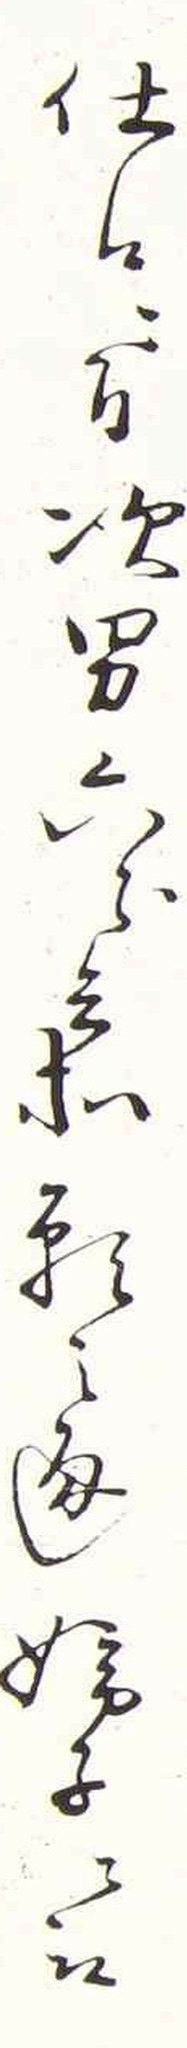仕候ニ付次男六郎兵衛願之通嫡子ニ被

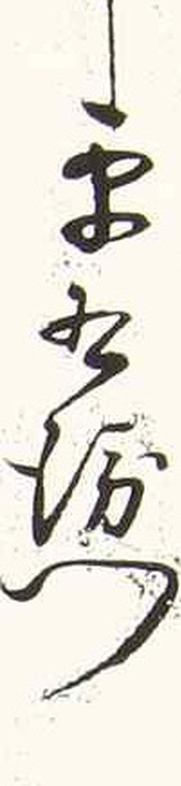平右衛門
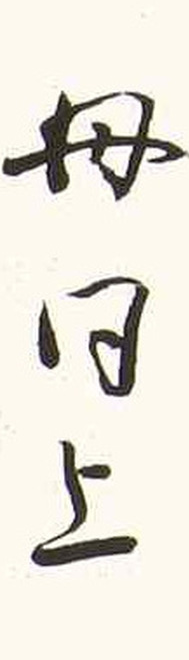母同上
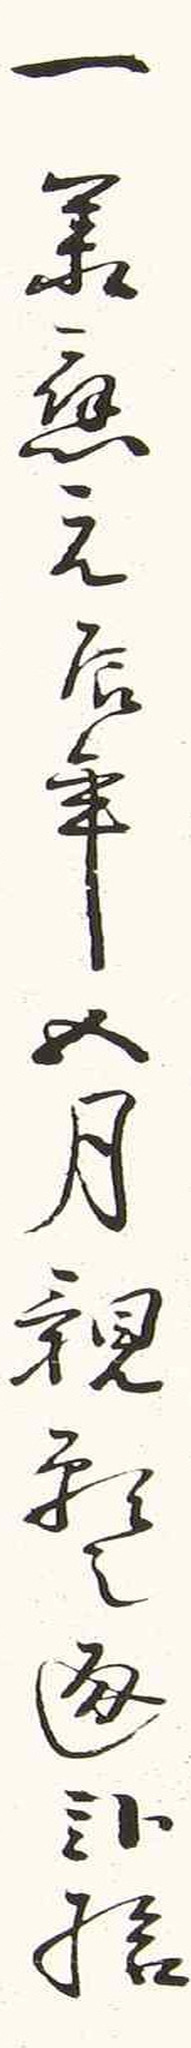一承応元辰年五月親願之通弐拾
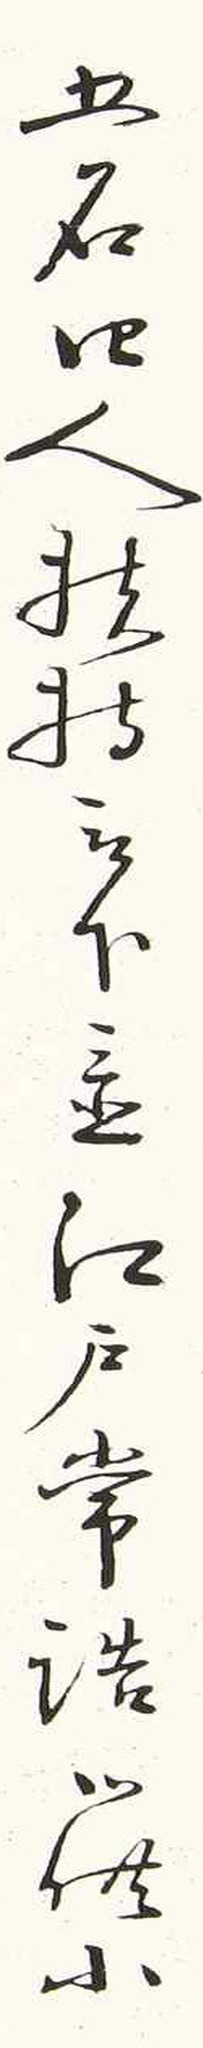五石四人扶持被下置江戸常詰御供小
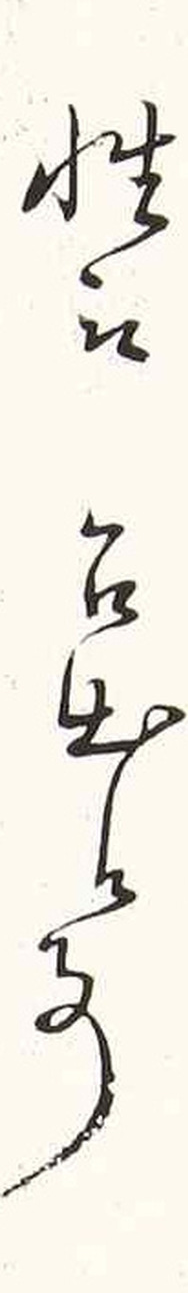性被召出候事
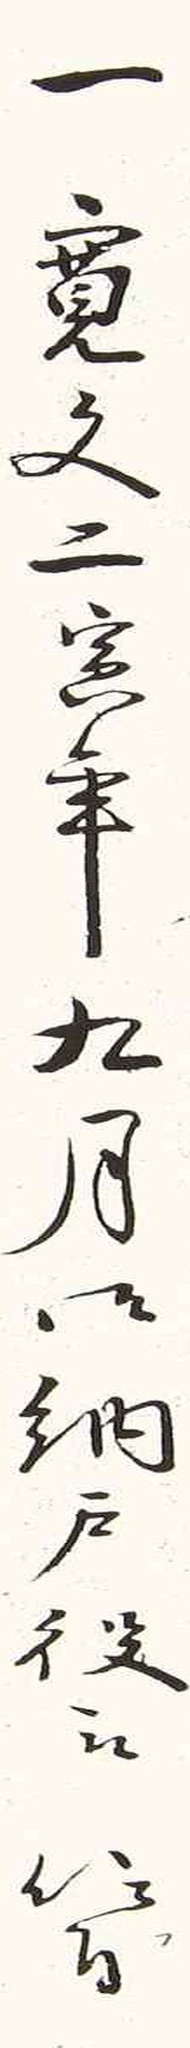一寛文二寅年九月御納戸役被仰付
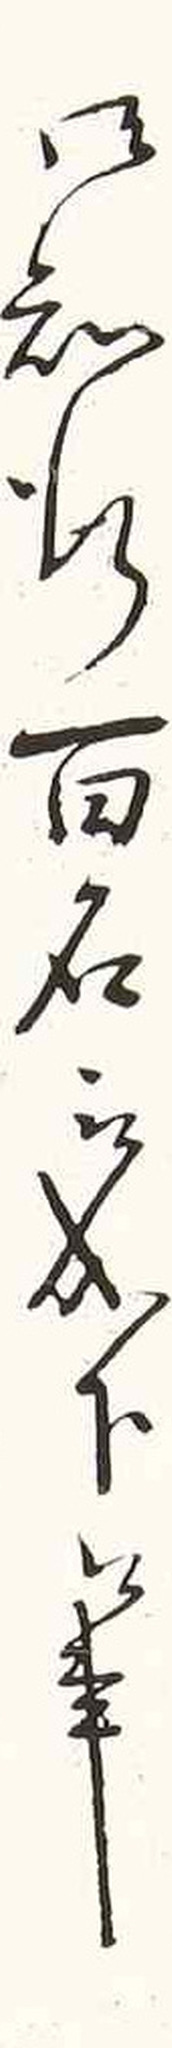御知行百石被成下候事
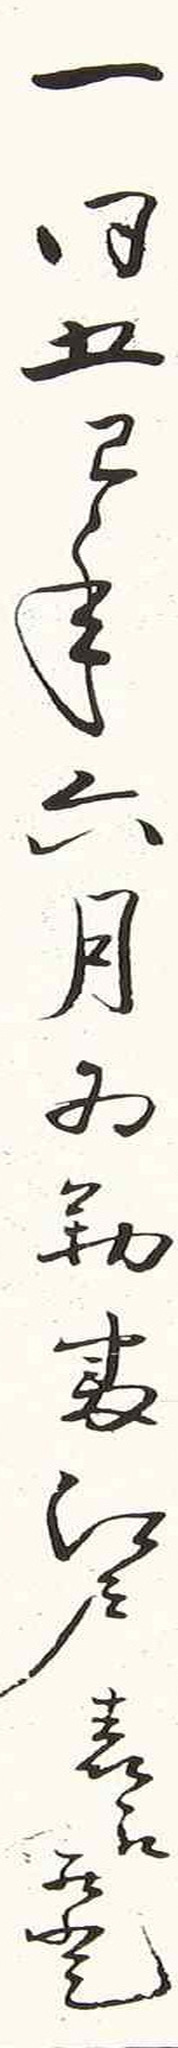一同五巳年六月為勤番江戸表江罷登
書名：諸士系譜　巻之357　す之部7
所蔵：会津若松市立会津図書館
